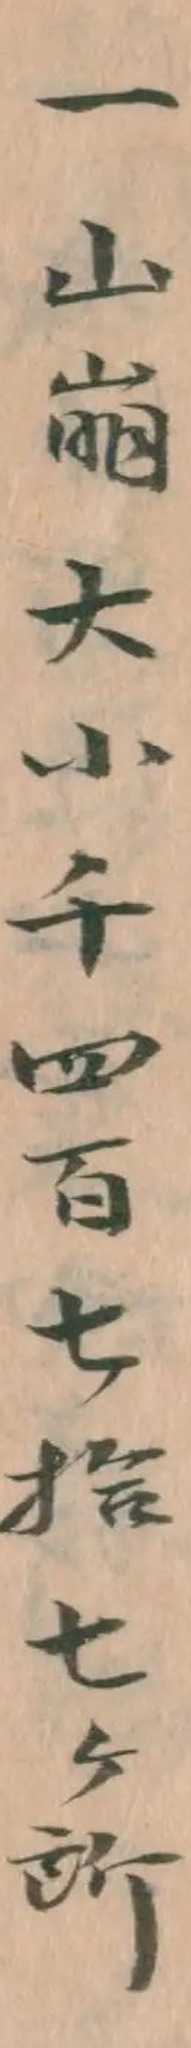一山崩大小千四百七拾七ヶ所
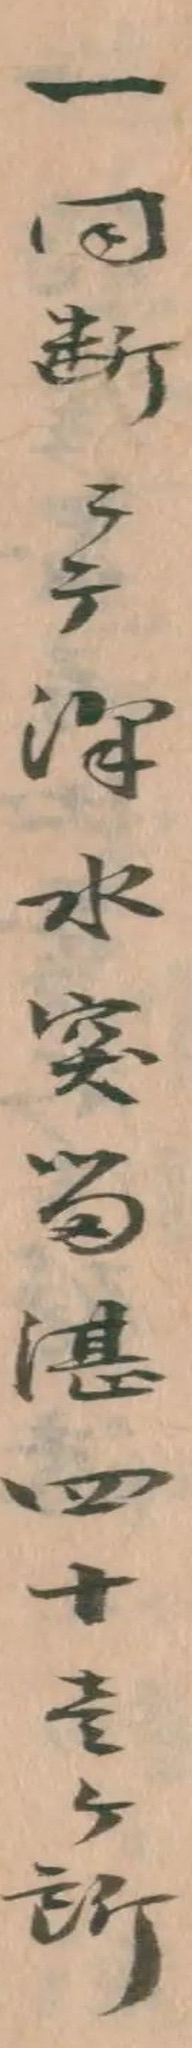一同断二而沢水突留湛四十壱ヶ所
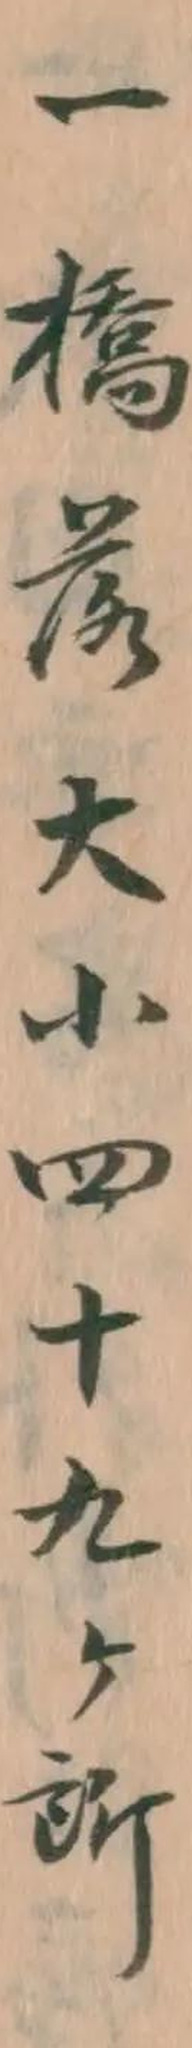一橋落大小四十九ヶ所
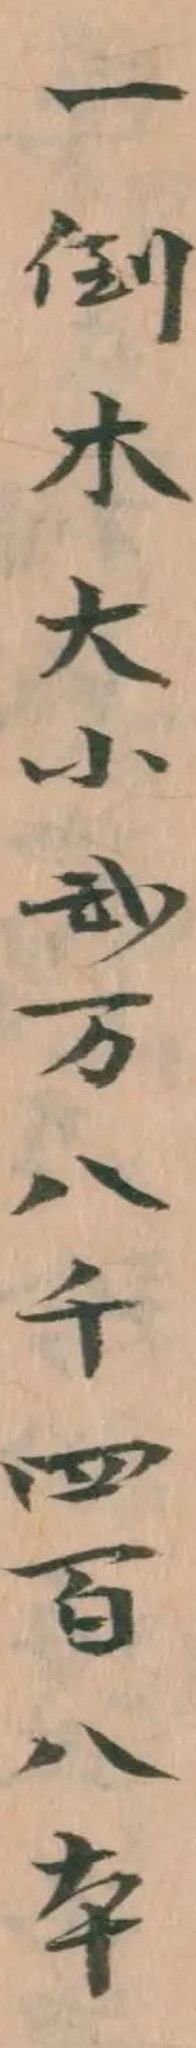一倒木大小弐万八千四百八本
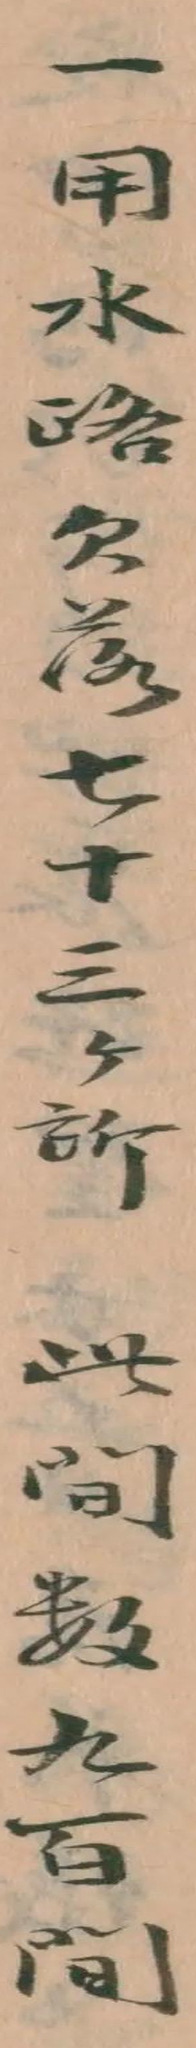一用水路欠落七十三ヶ所此間数九百間
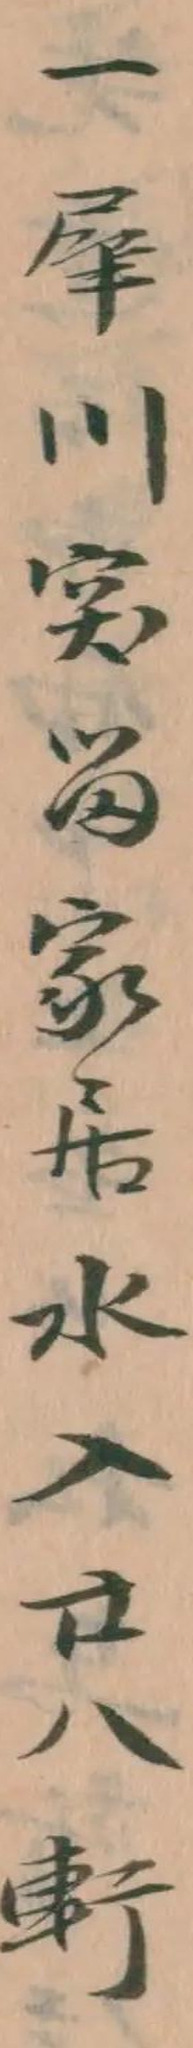一犀川突留家居水入廿八軒
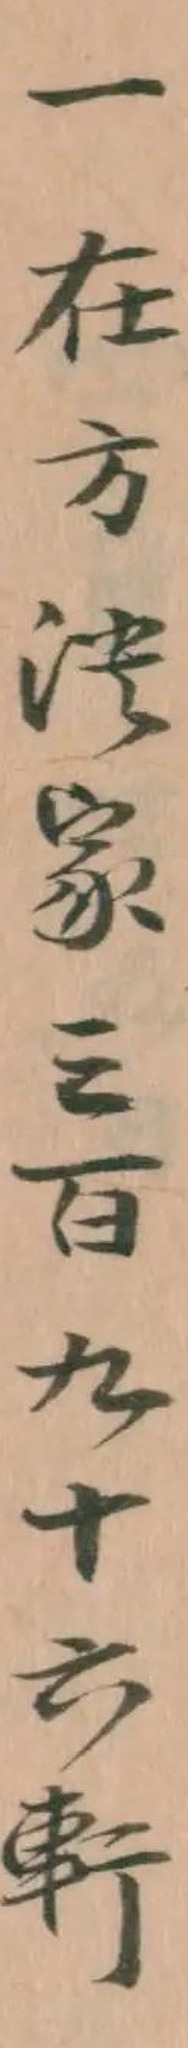一在方潰家三百九十六軒
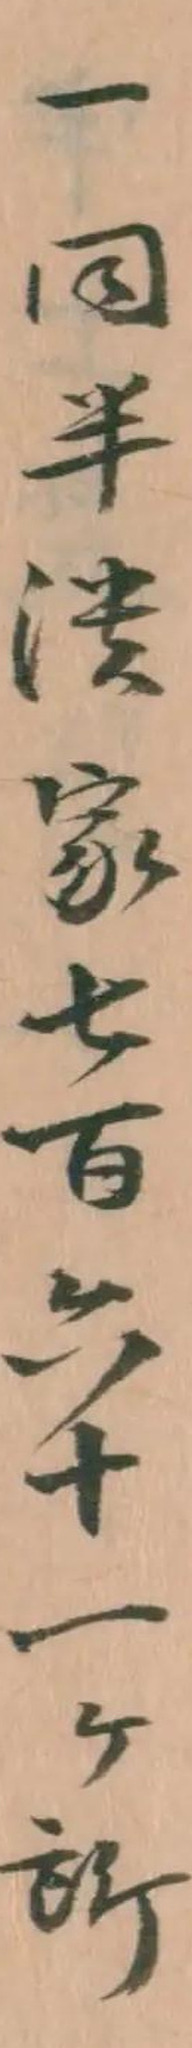一同半潰家七百六十一ヶ所
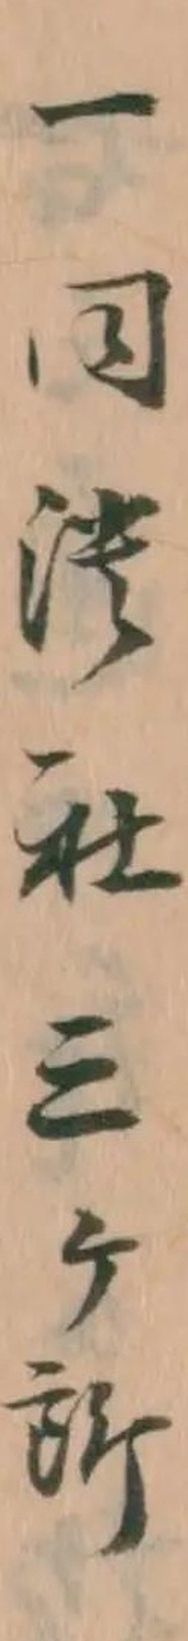一同潰社三ヶ所
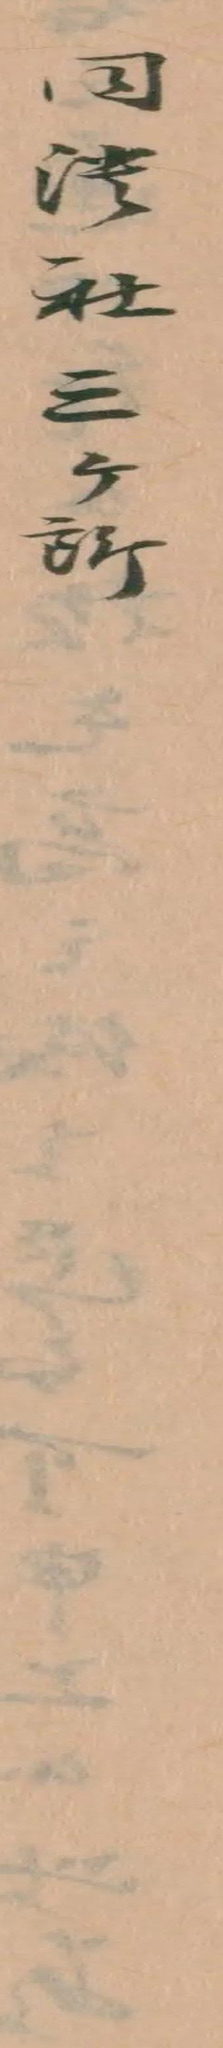一同潰社三ヶ所
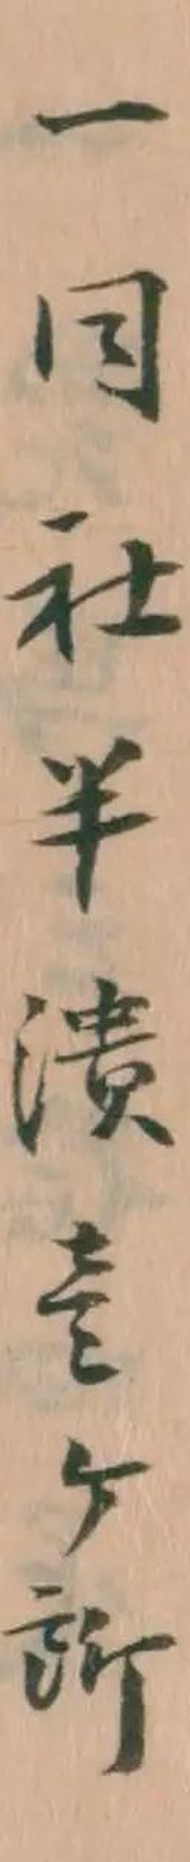一同社半潰壱ヶ所
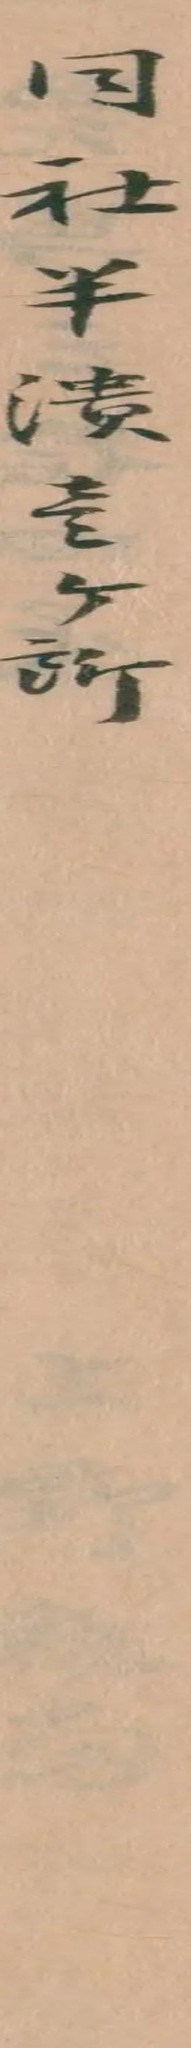一同社半潰壱ヶ所
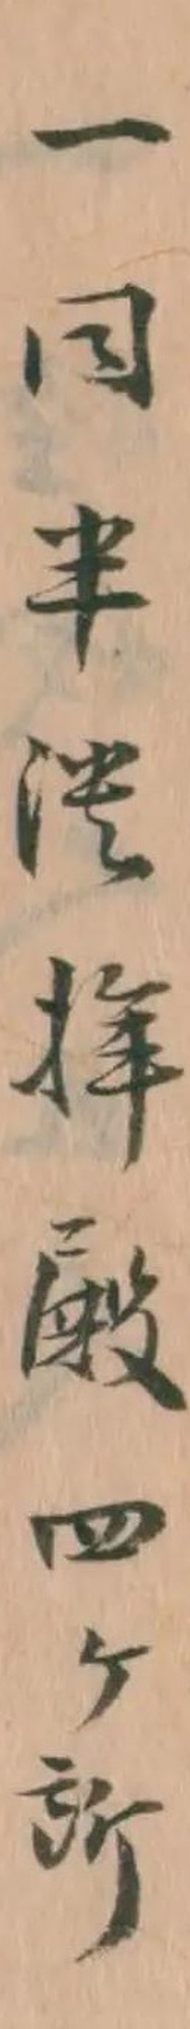一同半潰拝殿四ヶ所
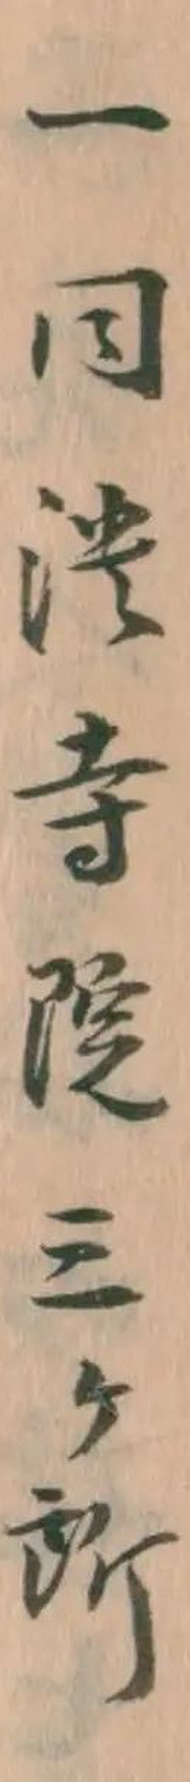一同潰寺院三ヶ所
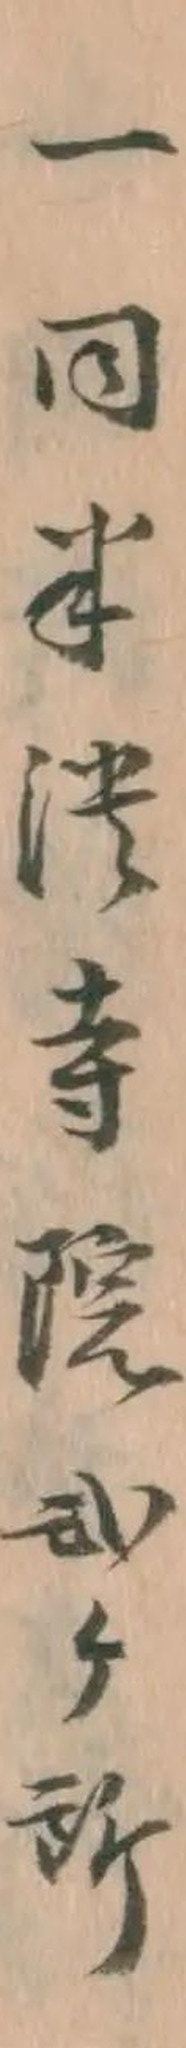一同半潰寺院弐ヶ所
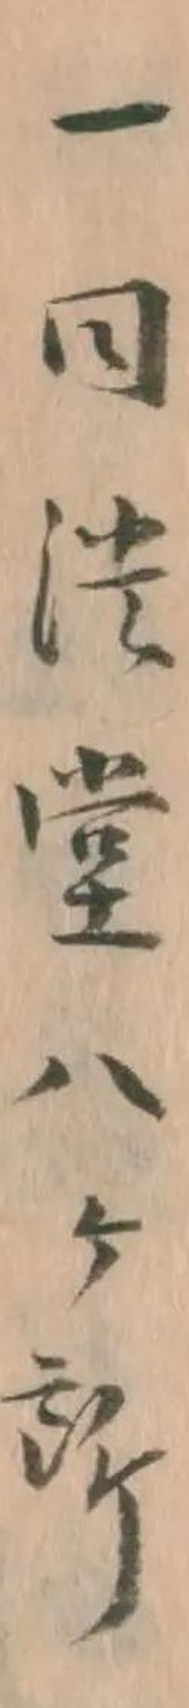一同潰堂八ヶ所
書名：地災撮要. 巻3(地震之部)-巻4(噴火之部)
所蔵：国立国会図書館 National Diet Library, JAPAN
